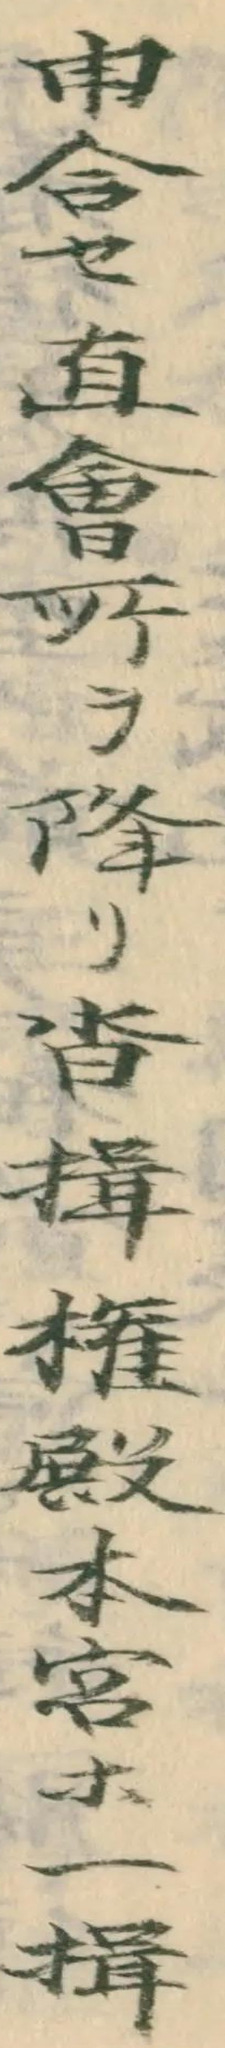申合セ直会所ヲ降リ沓揖権殿本宮等一揖
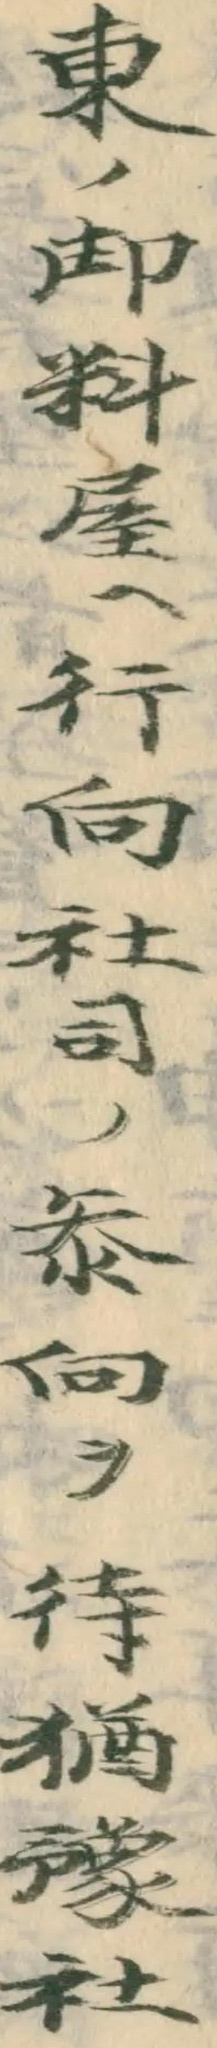東ノ御料屋ヘ行向社司ノ参向ヲ待猶予社
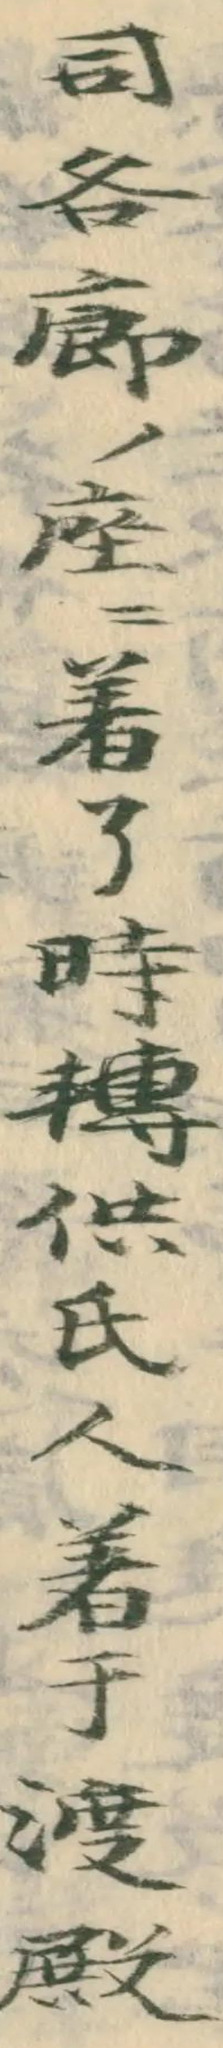司各廊ノ座ニ着了時転供氏人着于渡殿
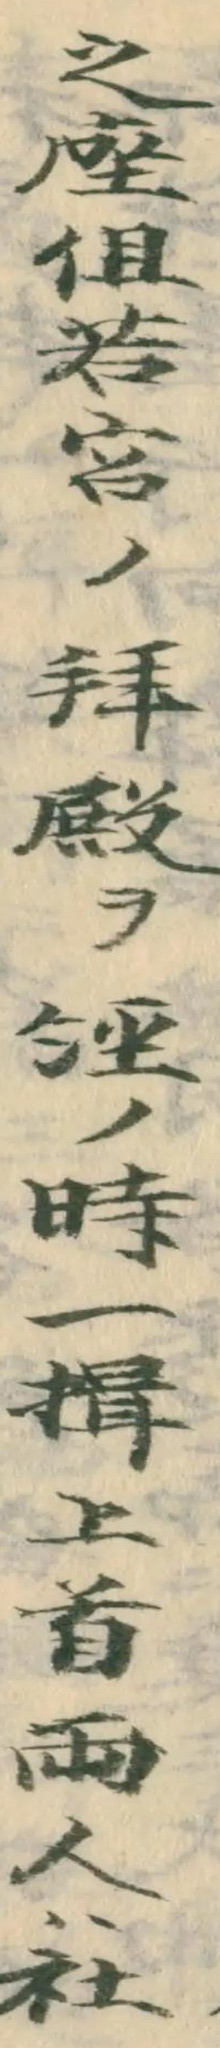之座但若宮ノ拝殿ヲ経ノ時一揖上首両人ハ社
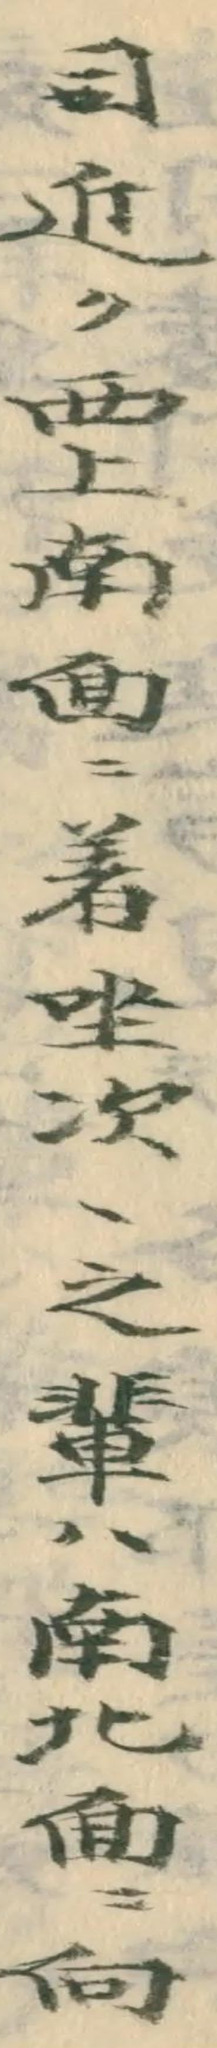司近ク西上南面ニ着坐次々之輩ハ南北面ニ向
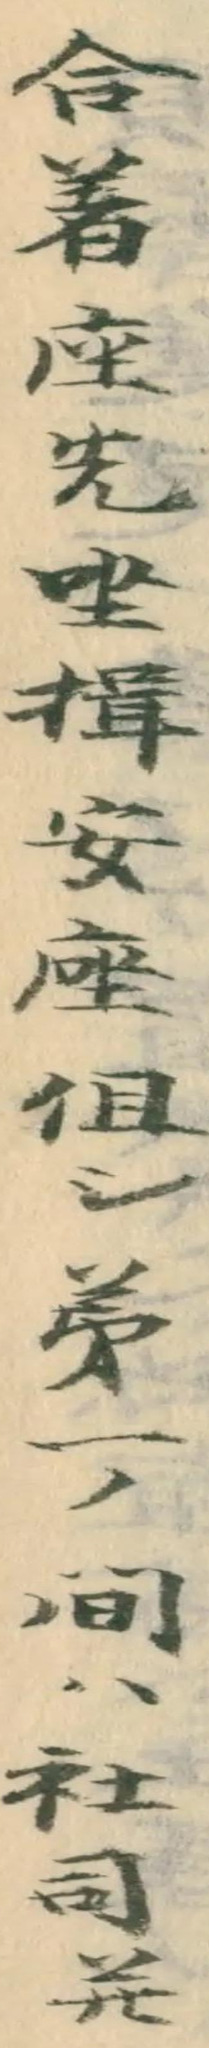合着座先坐揖安座但シ第一ノ間ハ社司并

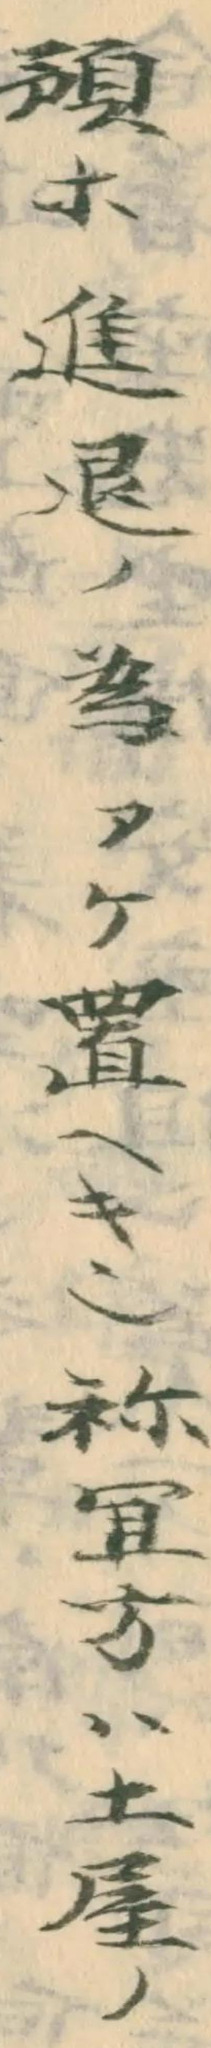預等進退ノ為アケ置ヘキ也禰宜方ハ土屋ノ
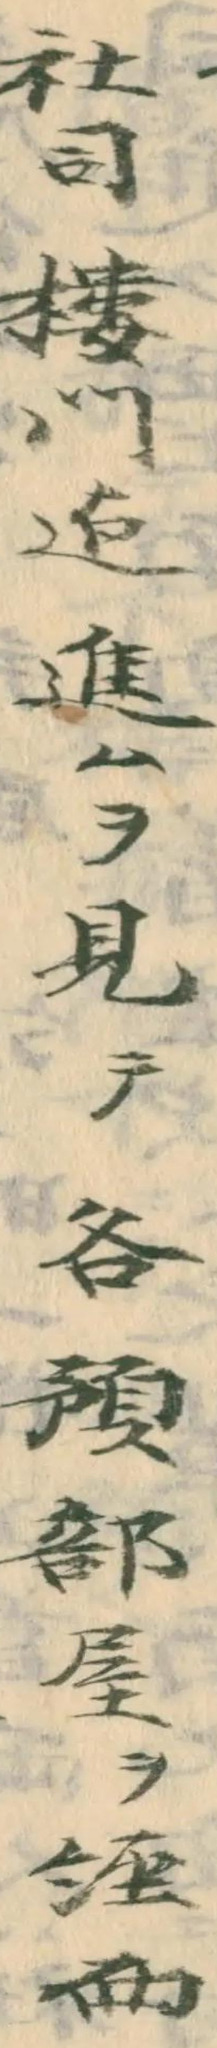社司桜門迄進ムヲ見テ各預部屋ヲ経西
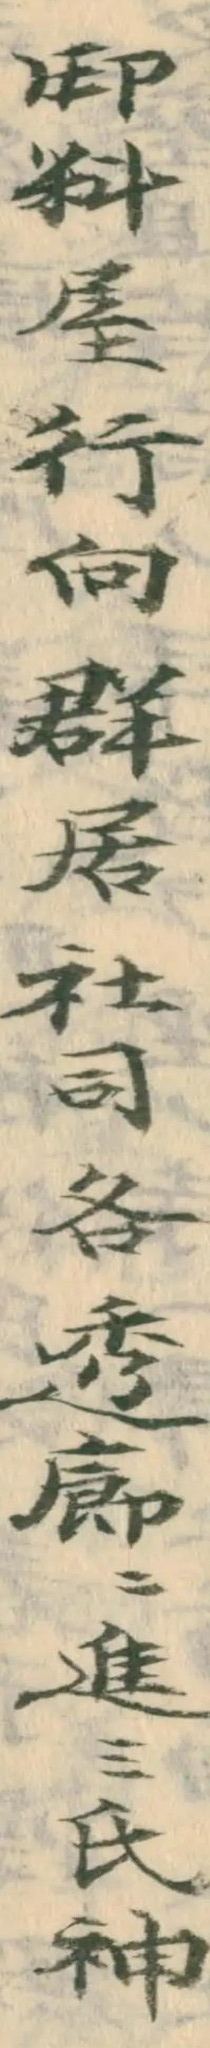御料屋行向群居社司各透廊ニ進ミ氏神
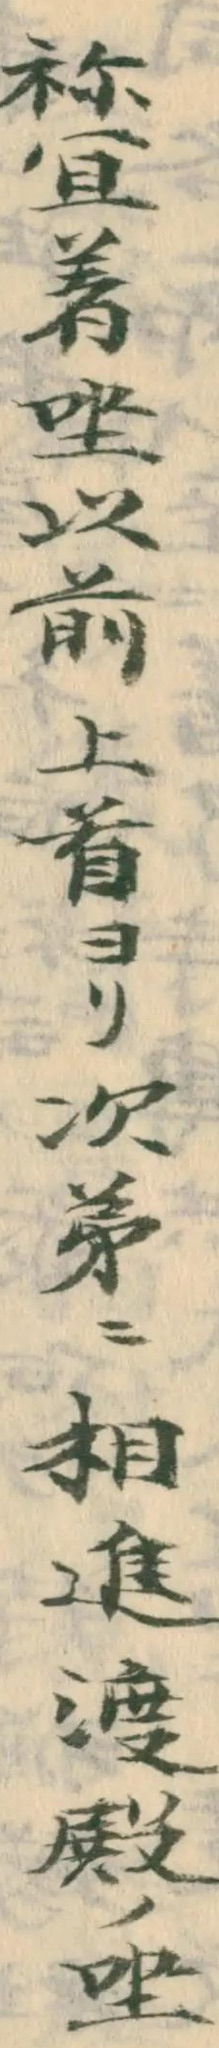禰宜着坐以前上首ヨリ次第ニ相進渡殿ノ坐
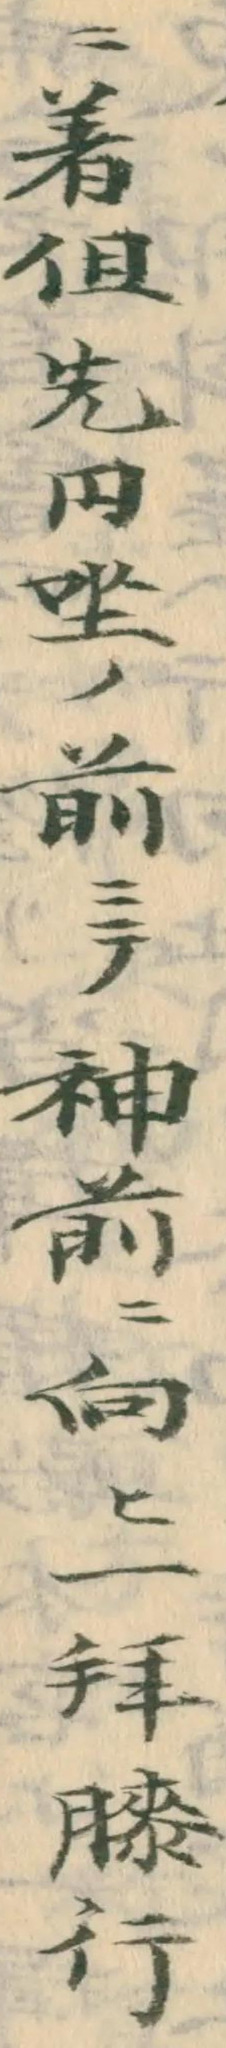ニ着但先円座ノ前ニテ神前ニ向ヒ一拝膝行
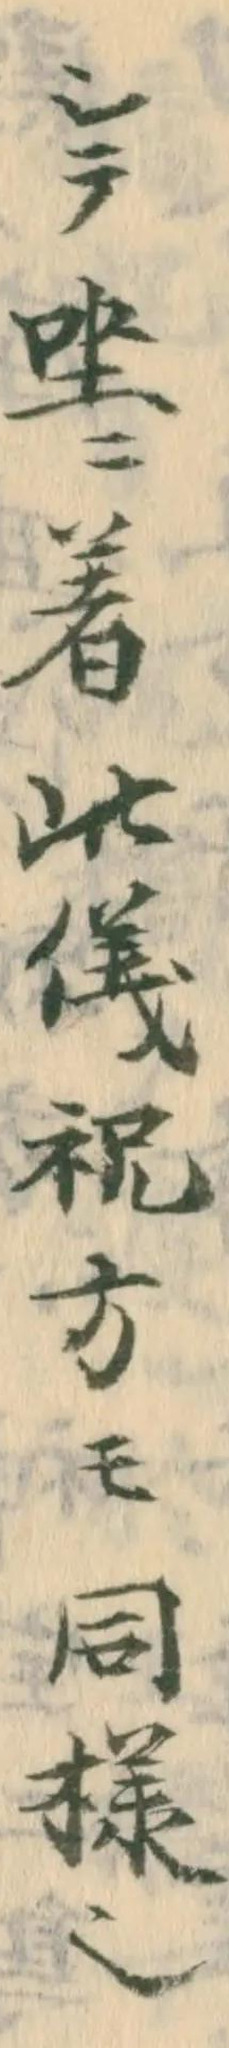シテ坐ニ着此儀祝方モ同様也
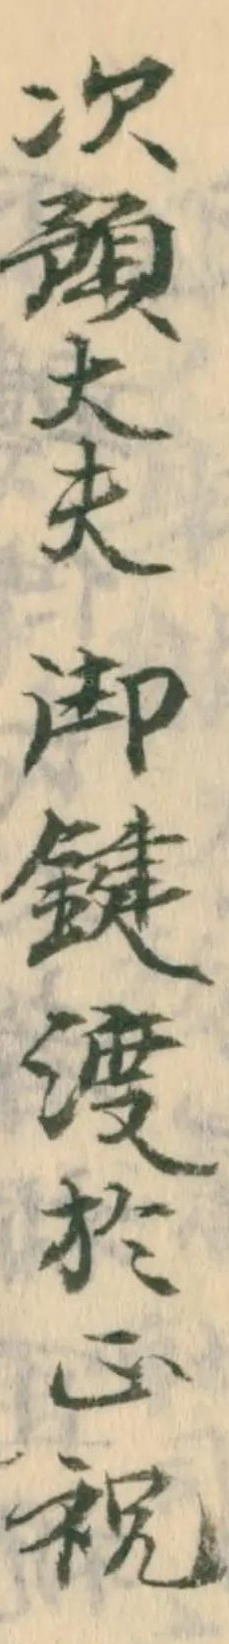次預大夫御鍵渡於正祝
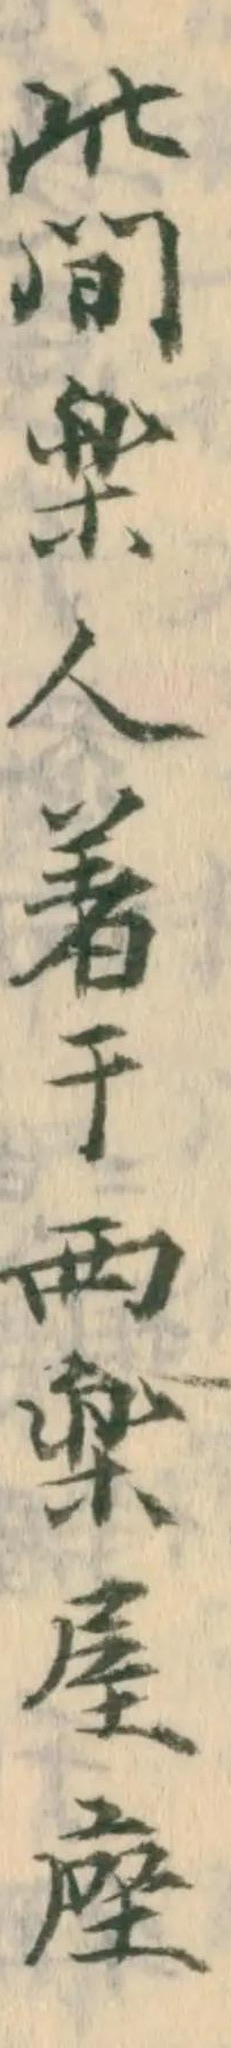此間楽人着于西楽屋座
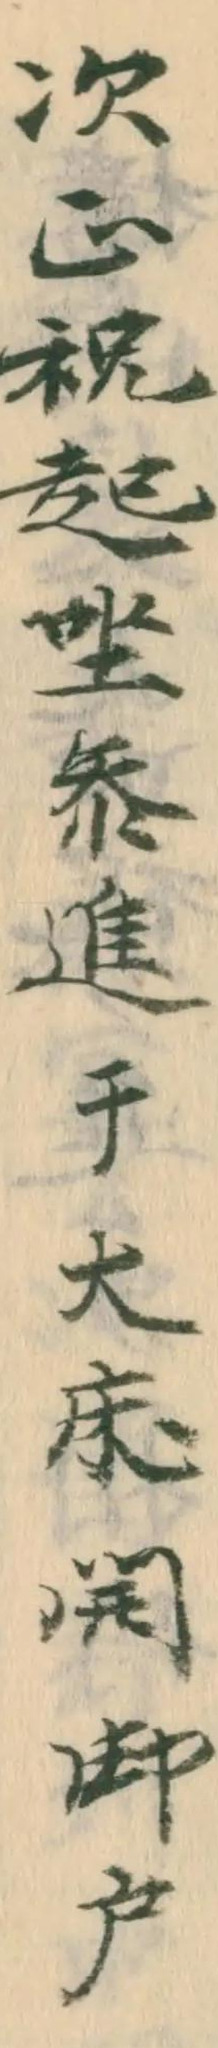次正祝起坐参進于大床開御戸
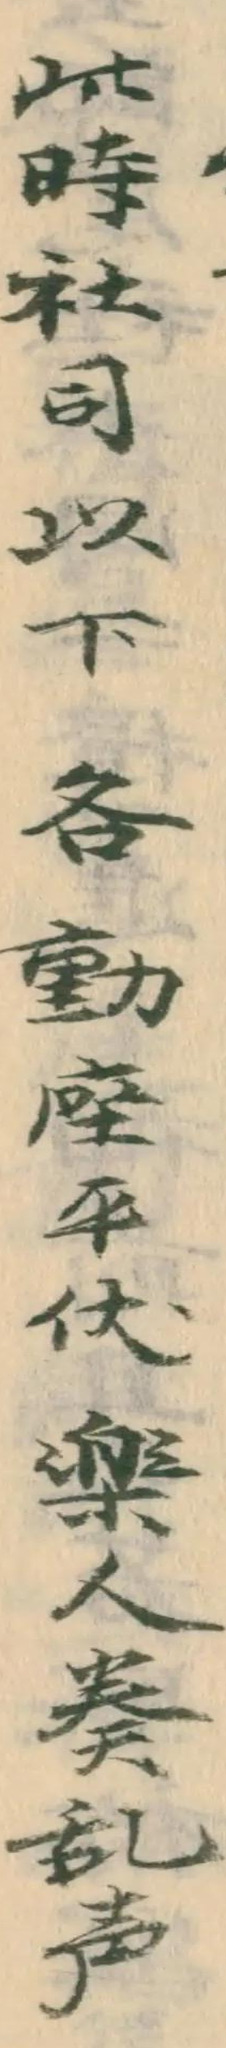此時社司以下各動座平伏楽人奏乱声
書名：賀茂社記録. 第5冊
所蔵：国立国会図書館 National Diet Library, JAPAN
